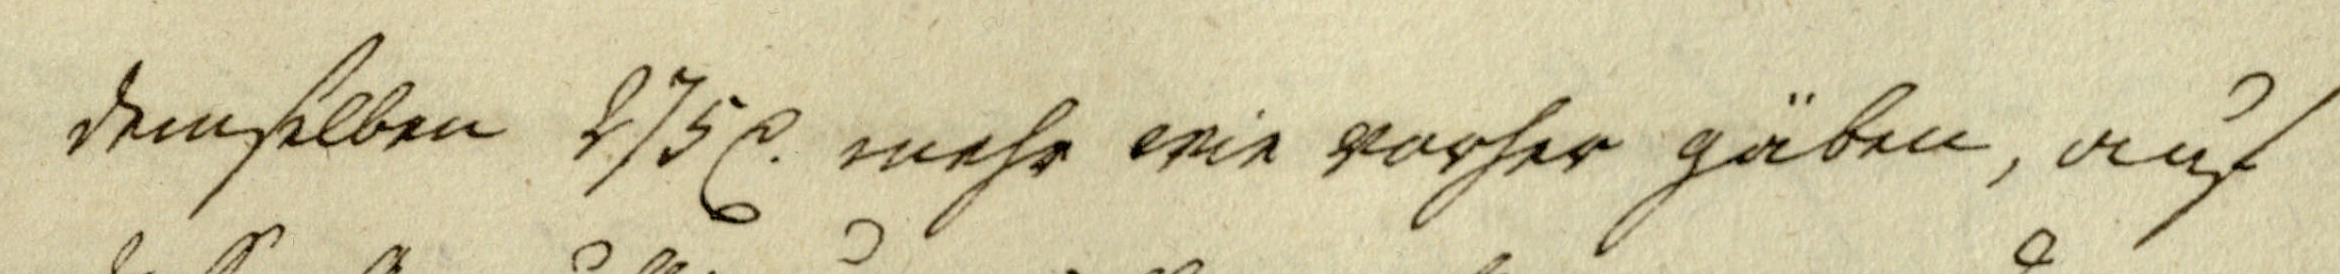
demselben 275 c. mehr wie vorher gäben, auf
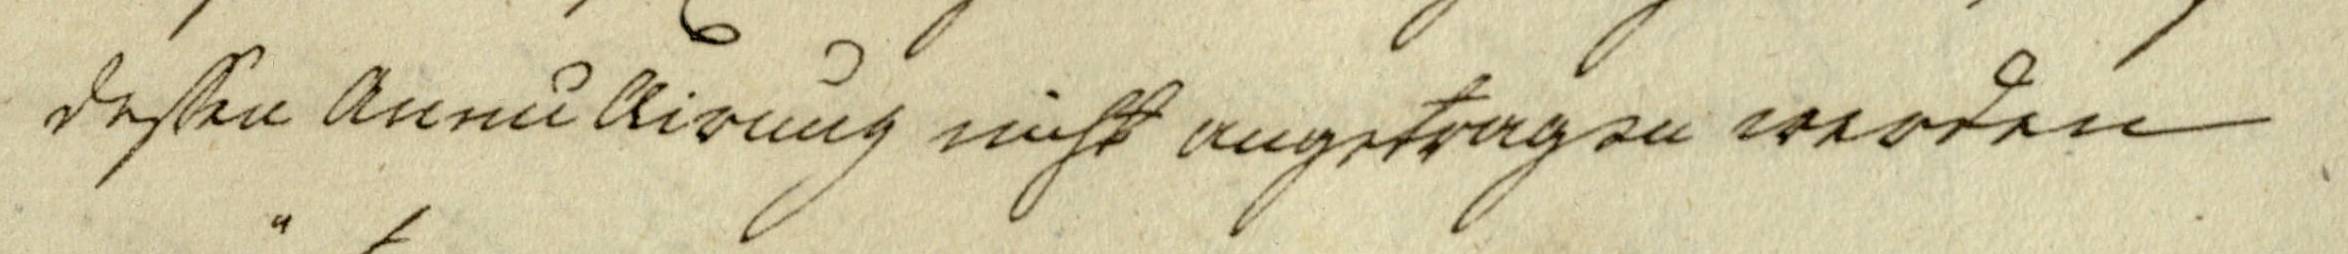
dessen Annullirung nicht angetragen werden
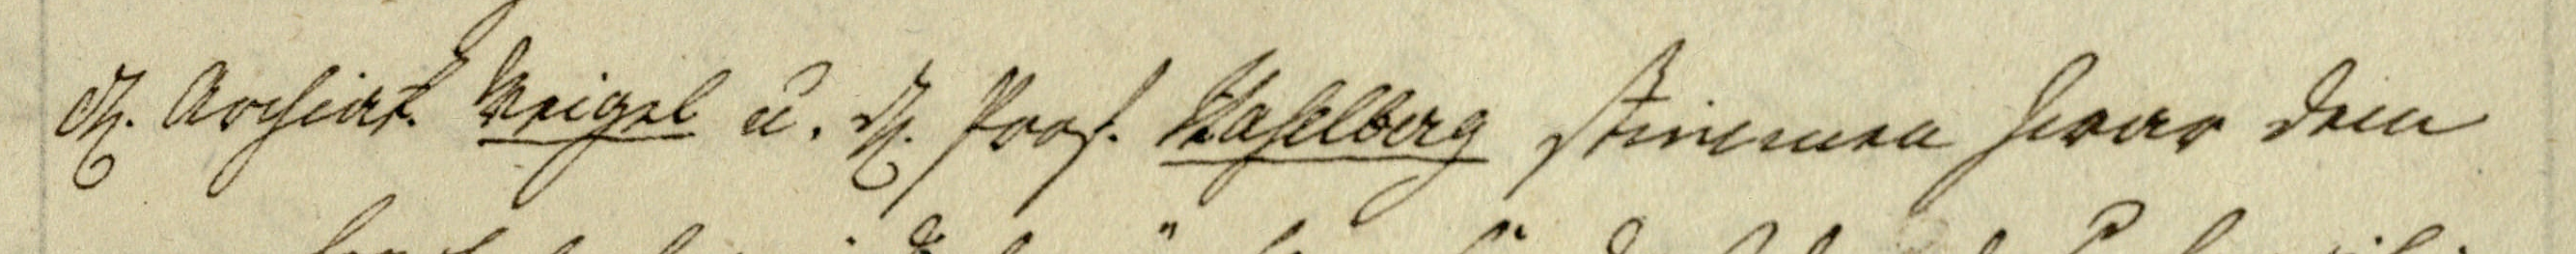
dh. Archiat. Weigel u. dh. Prof. Haselberg stimmen zwar dem
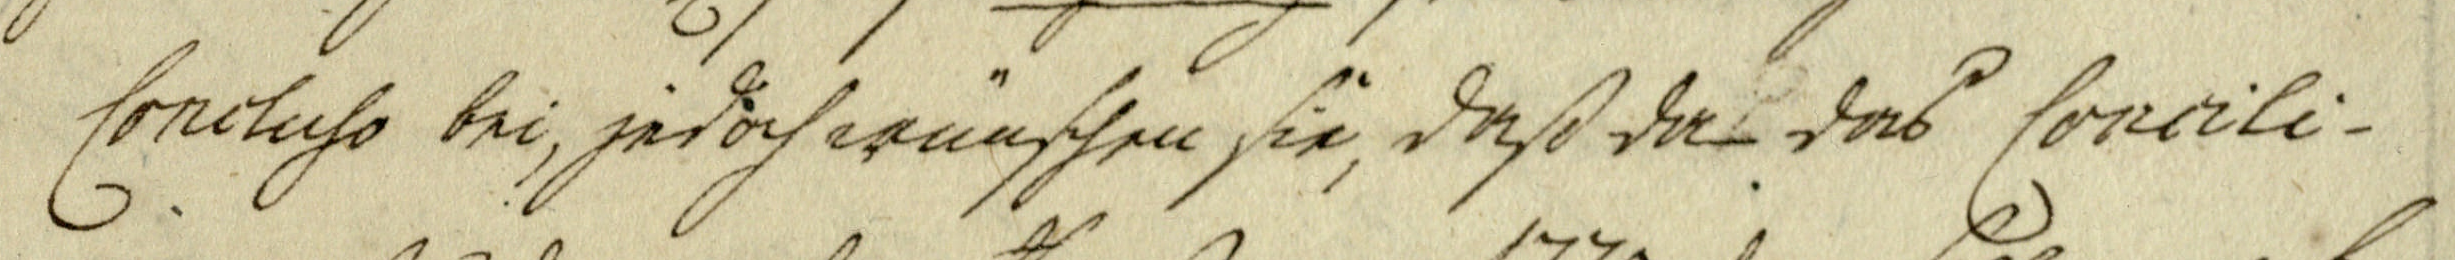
Concluso bei, jedoch wünschen sie, daß da das Concili¬
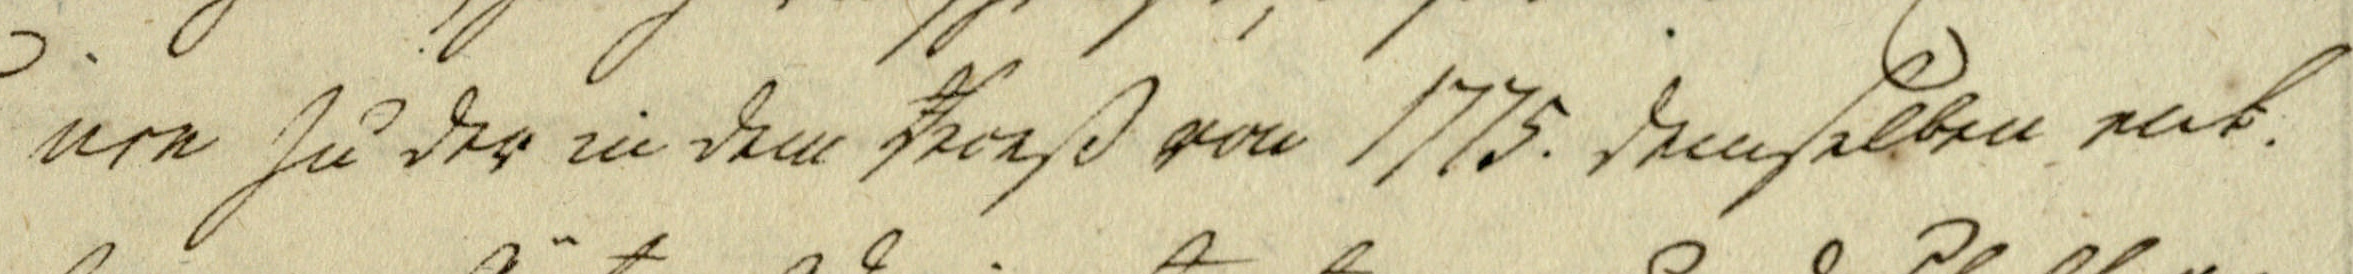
um zu der in dem Receß von 1775. demselben ent¬
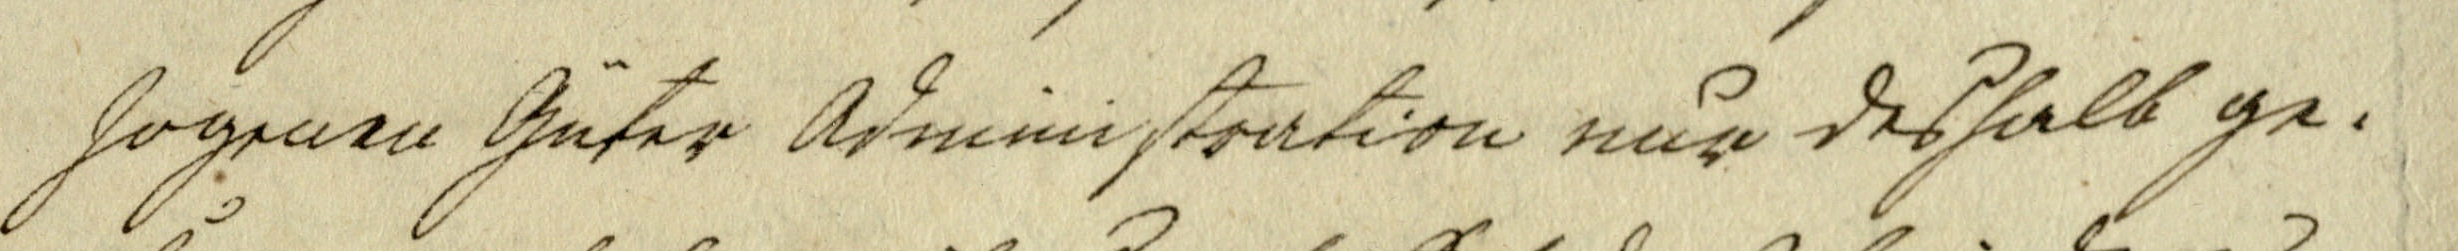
zogenen Güter Administration nur deshalb ge¬
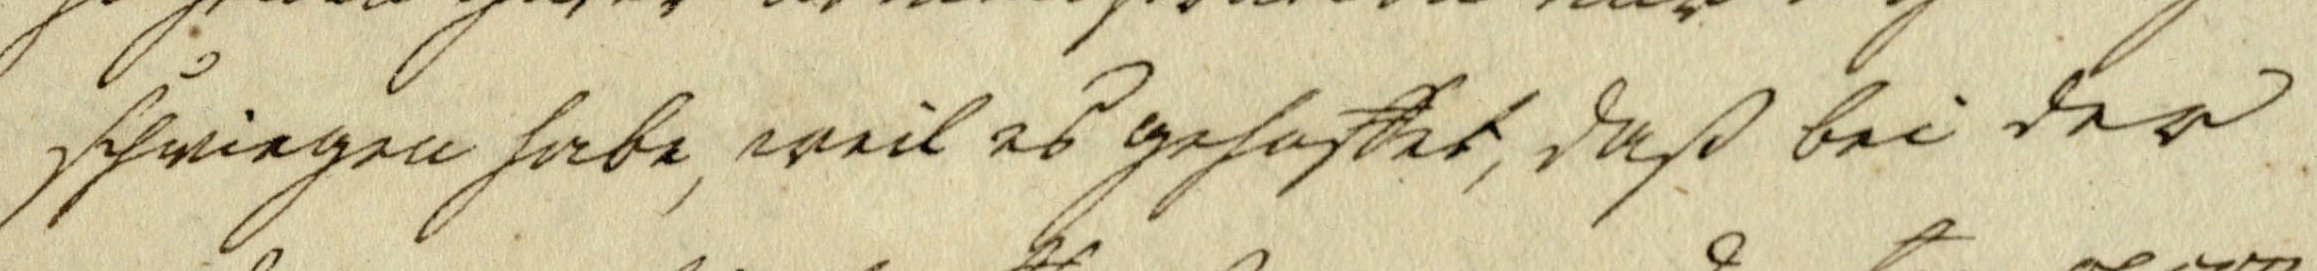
schwiegen habe weil es gehoffet, daß bei der
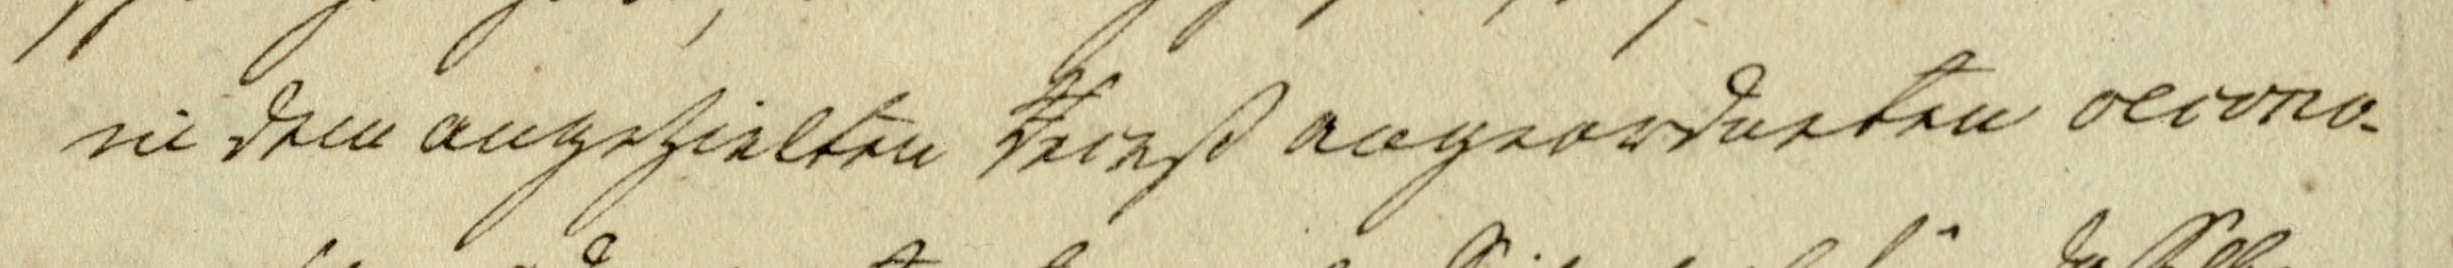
in dem angezielten Receß angeordneten oecono¬
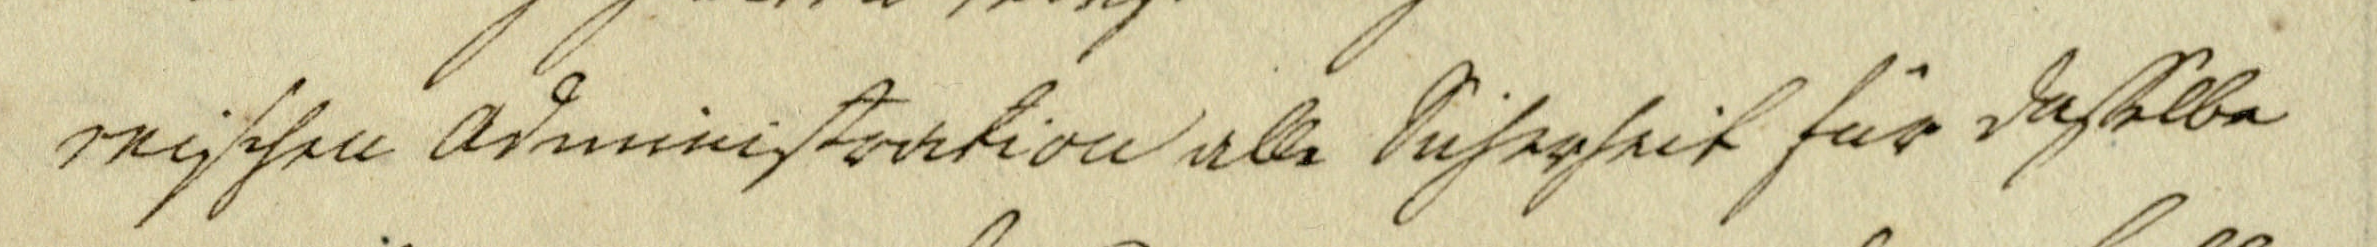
mischen Administration alle Sicherheit für dasselbe
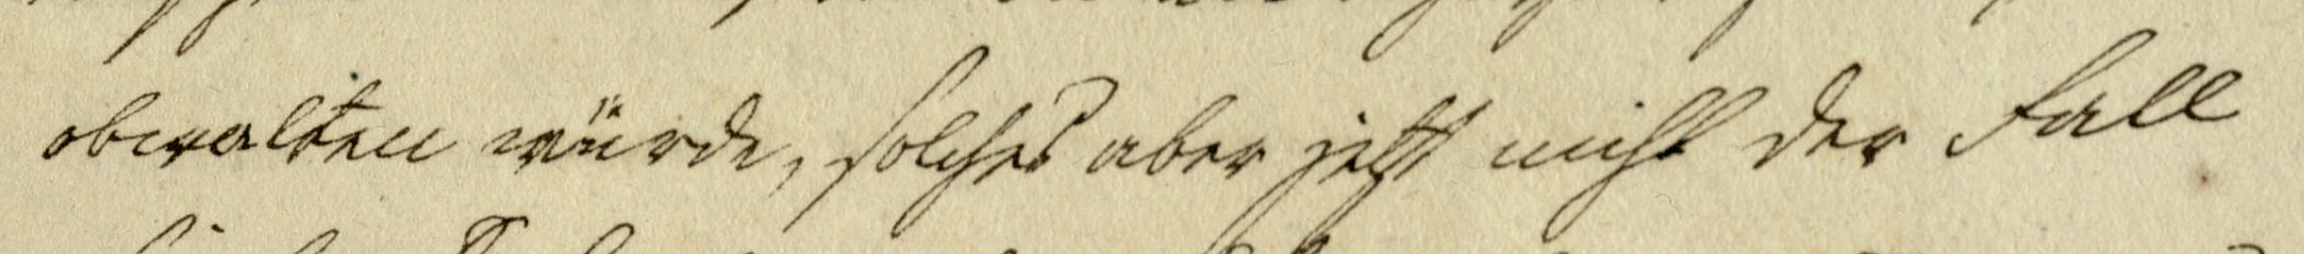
obwalten würde, solches aber jetzt nicht der Fall
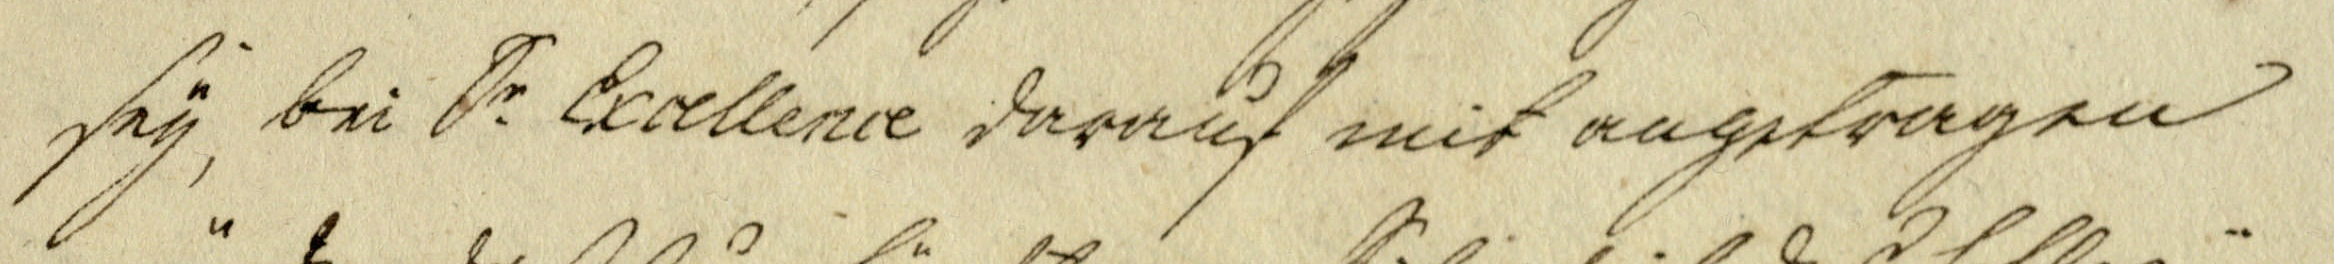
seÿ, bei Sr Excellence darauf mit angetragen
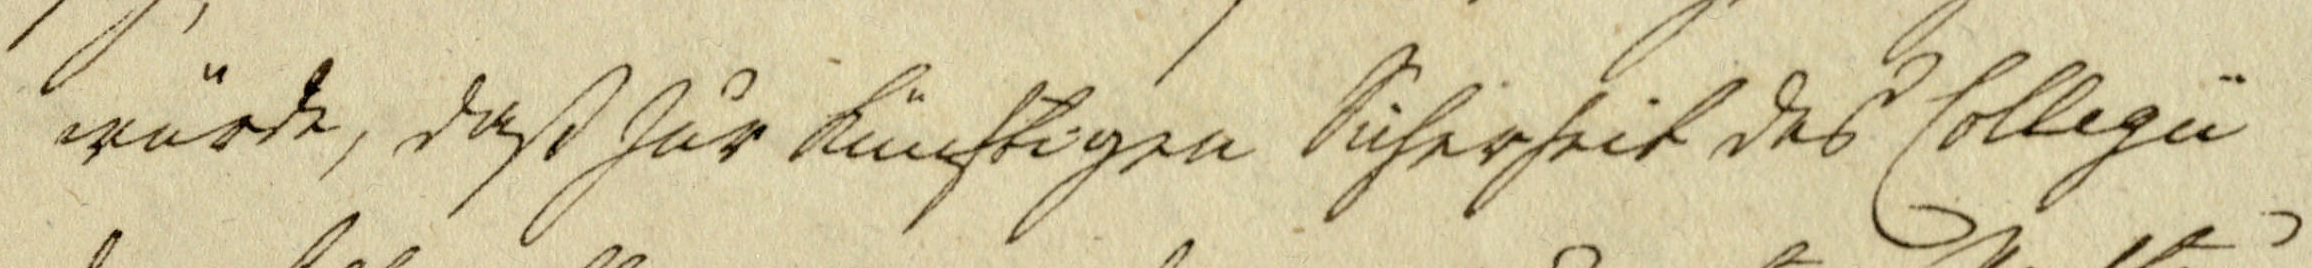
würde, daß zur künftigen Sicherheit des Collegii
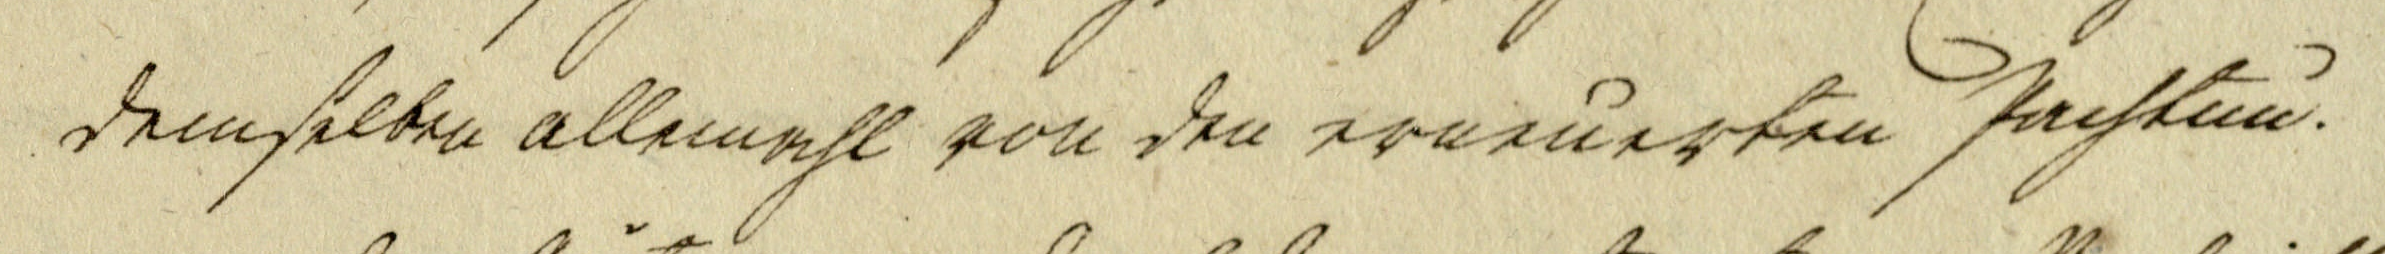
demselben allemahl von den erneuerten Pachtung¬
